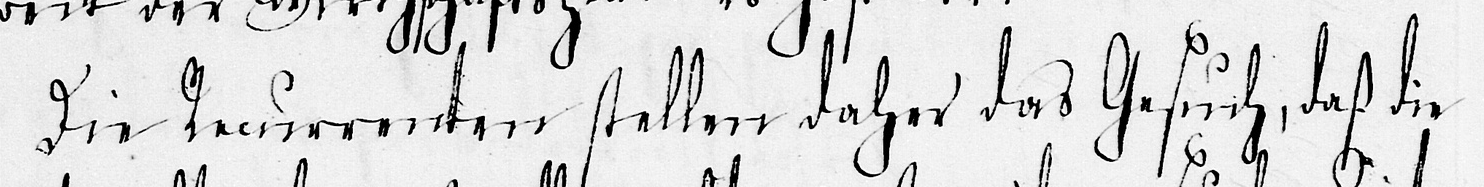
Die Recurrenten stellen daher das Gesuch, daß die
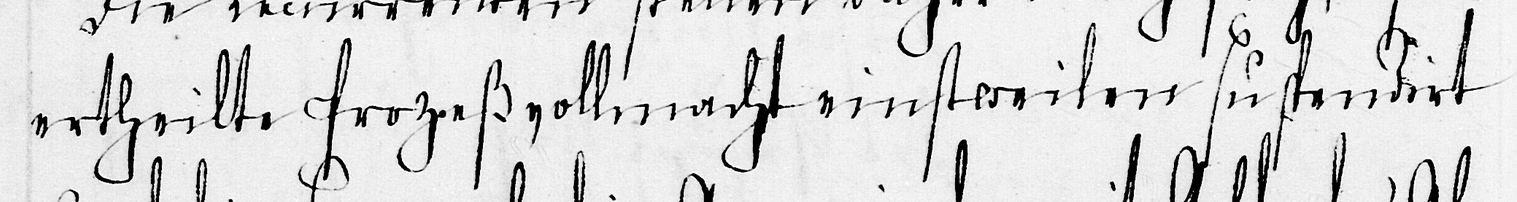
ertheilte Prozeßvollmacht einstweilen suspendirt
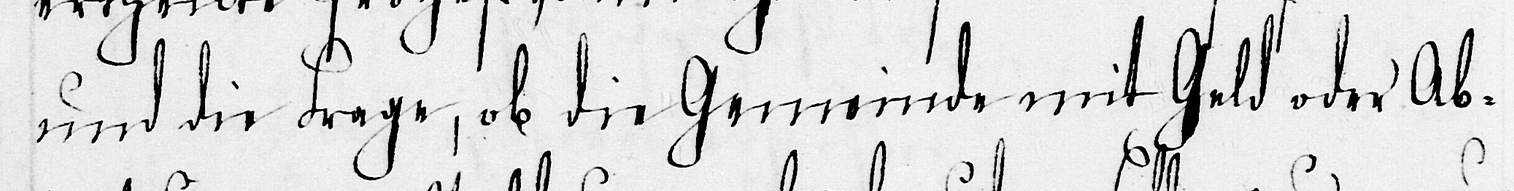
und die Frage, ob die Gemeinde mit Geld oder Ab¬
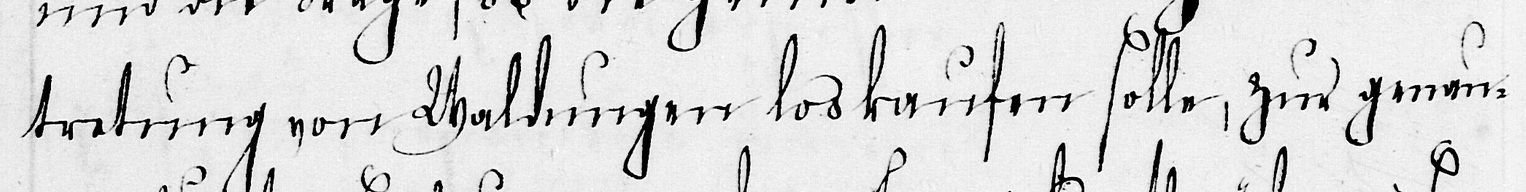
tretung von Waldungen loskaufen solle, zur genau¬
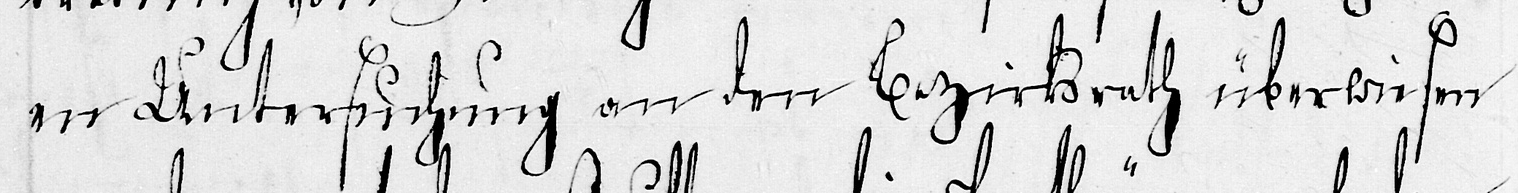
en Untersuchung an den Bezirksrath überwiesen
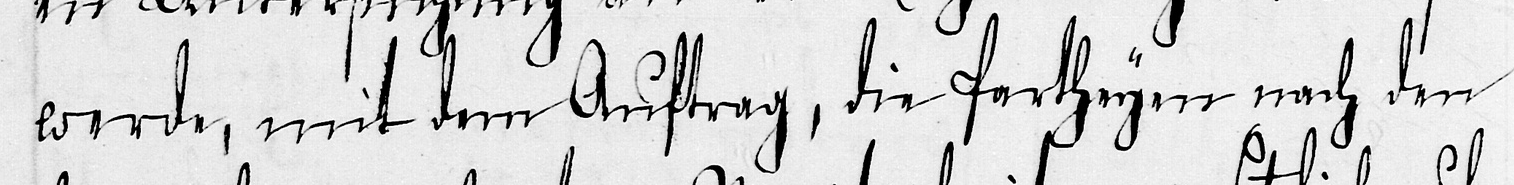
werde, mit dem Auftrag, die Partheyen nach den
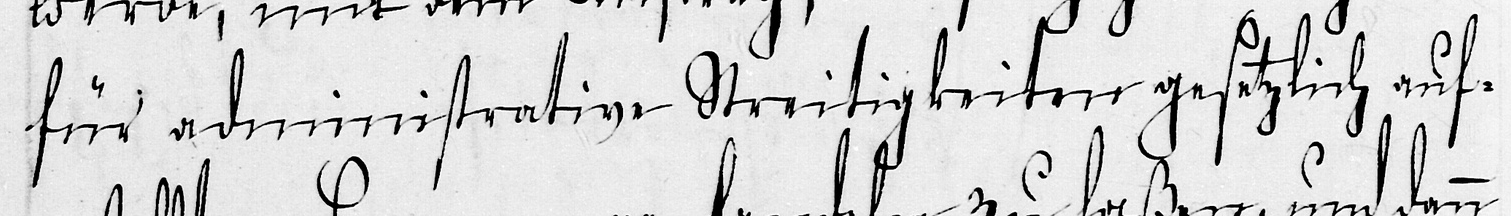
für administrative Streitigkeiten gesetzlich aufg¬
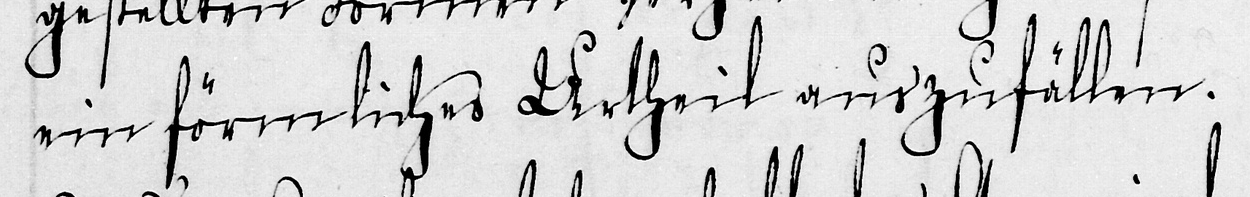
ein förmliches Urtheil auszufällen.
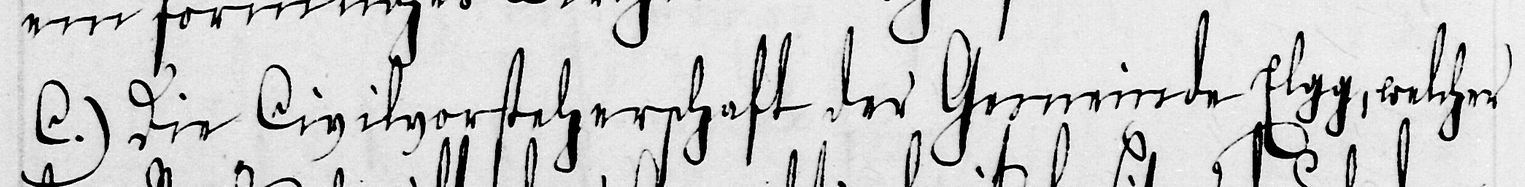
C.) Die Civilvorsteherschaft der Gemeinde Elgg, welcher
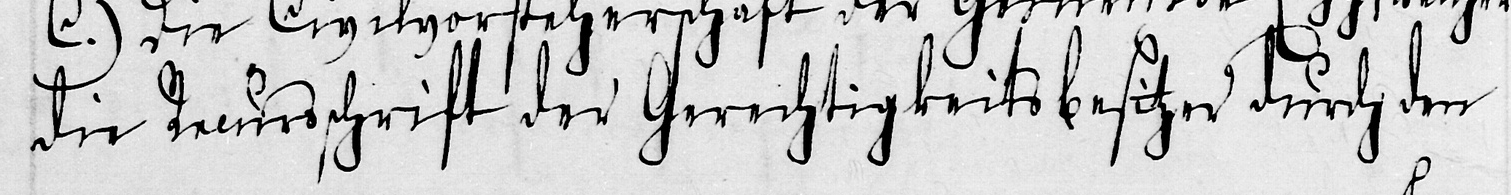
die Recursschrift der Gerechtigkeitsbesitzer durch den
